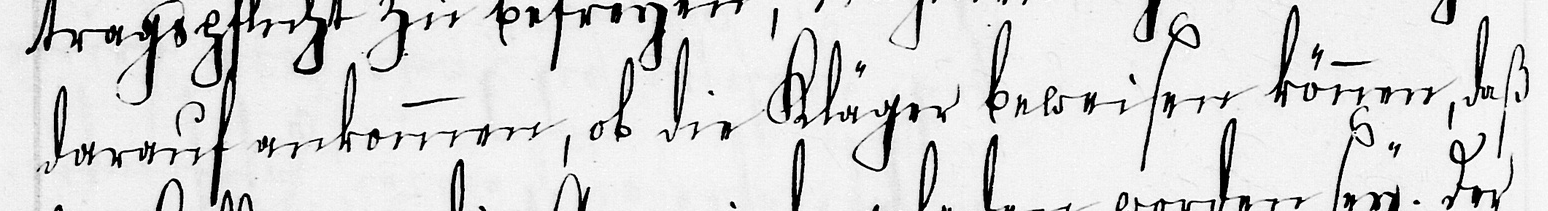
darauf ankommen, ob die Kläger beweisen können, daß
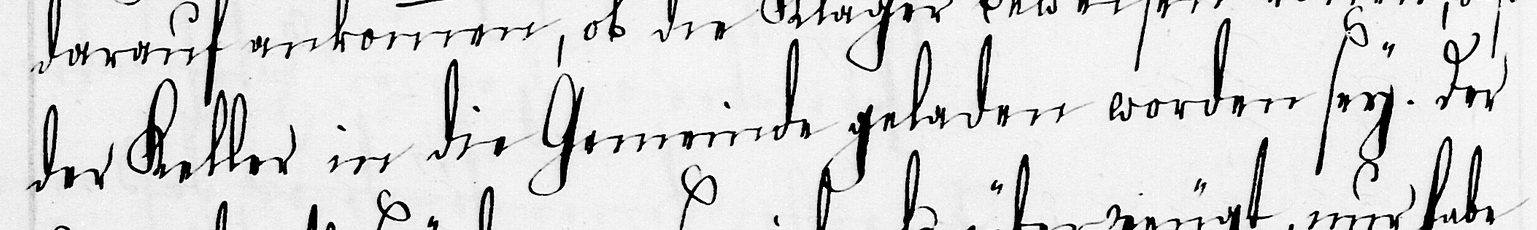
der Keller in die Gemeinde geladen worden sey. Der
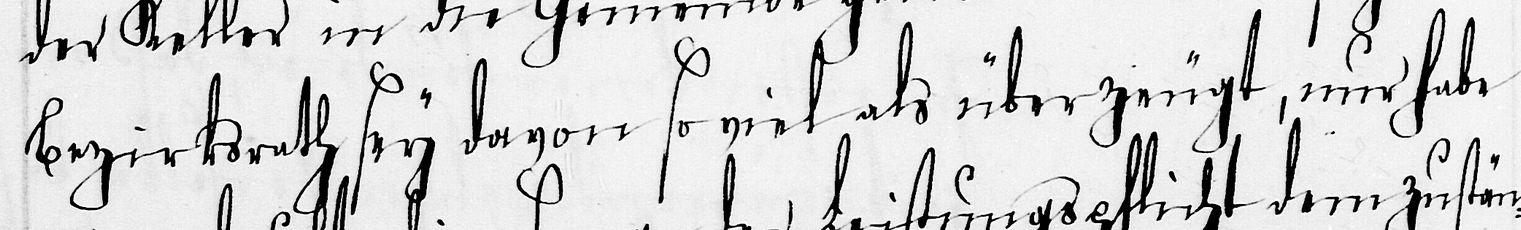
Bezirksrath sey davon so viel als überzeugt, nur habe
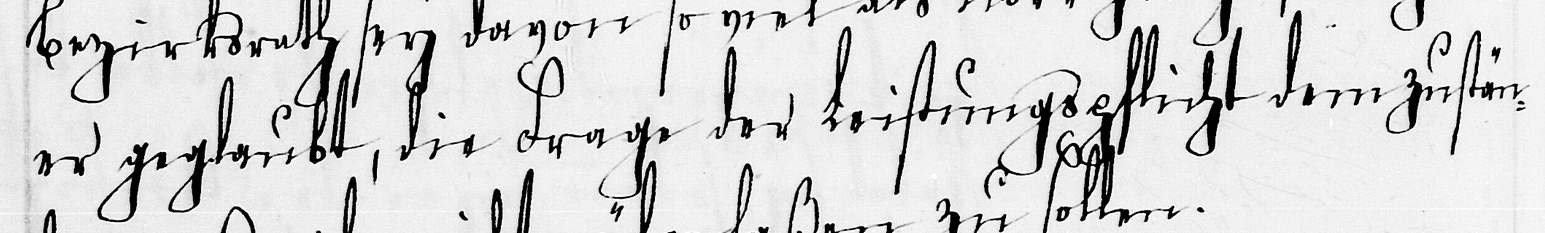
er geglaubt, die Frage der Leistungspflicht dem zustä¬
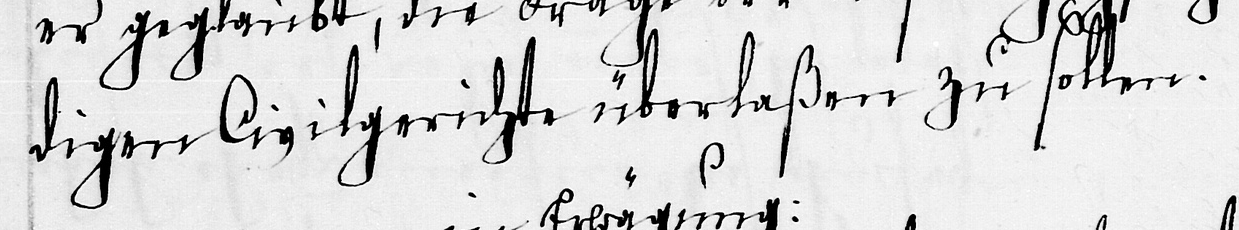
ndigen Civilgerichte überlaßen zu sollen.
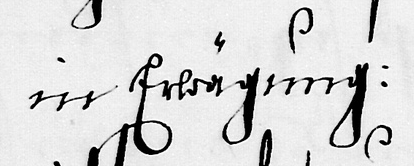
in Erwägung:
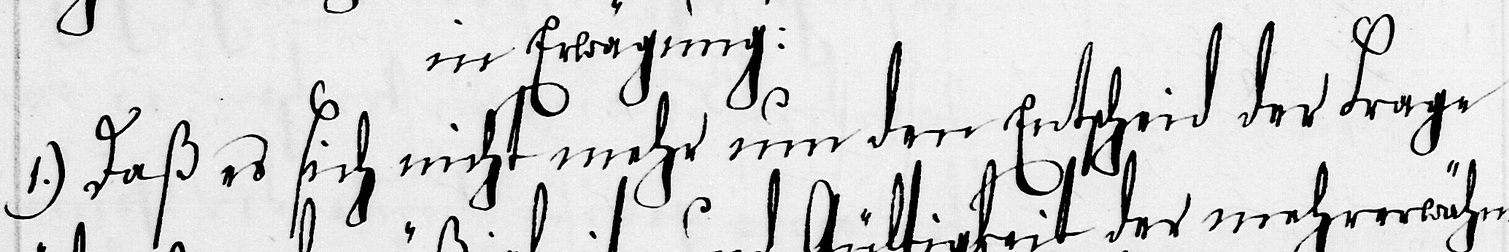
1.) Daß es sich nicht mehr um den Entscheid der Frage
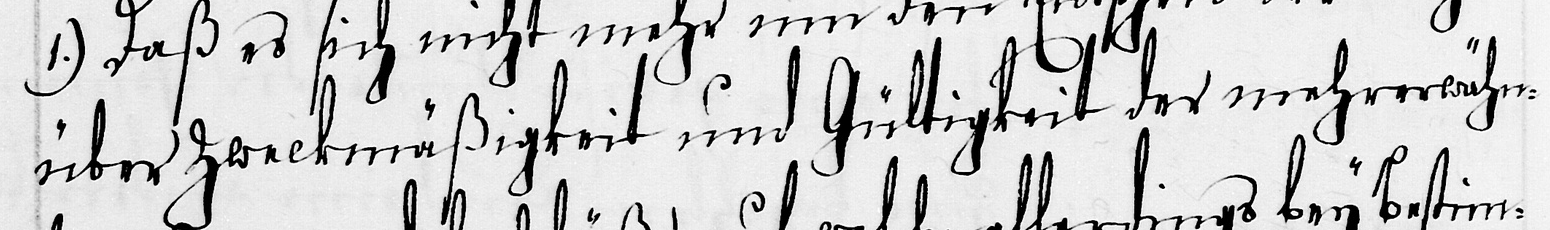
über Zweckmäßigkeit und Gültigkeit der mehrerwähn¬
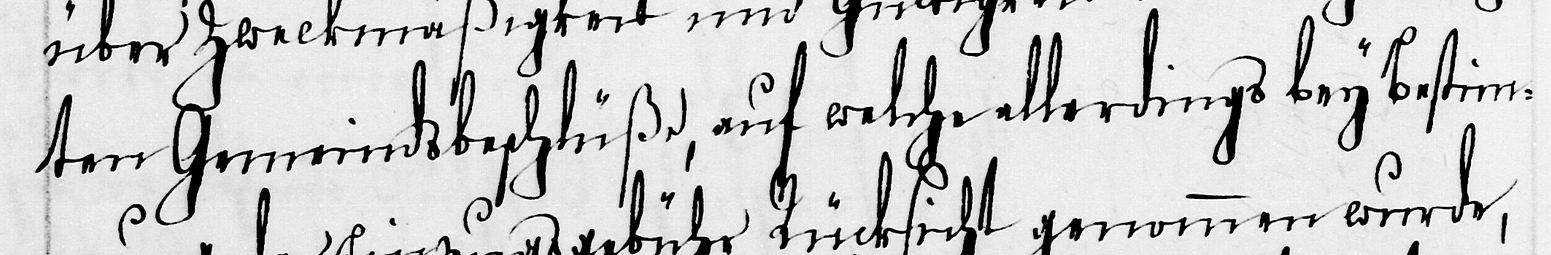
ten Gemeindsbeschlüße, auf welche allerdings bey Besti¬
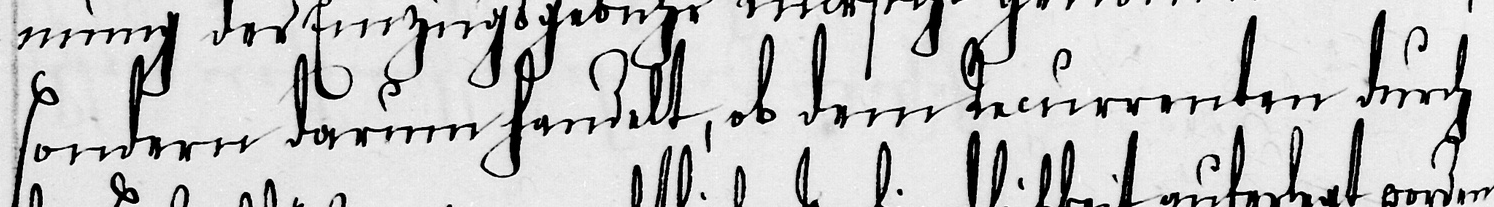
sondern darum handelt, ob dem Recurrenten durch
